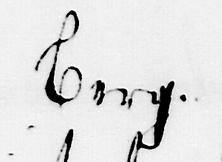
Berg.
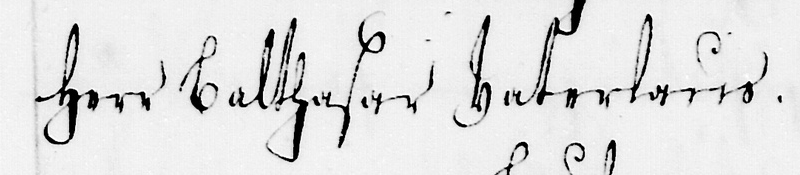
Herr Balthasar Vaterlaus.
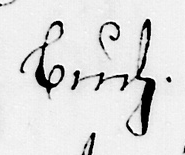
Buch.
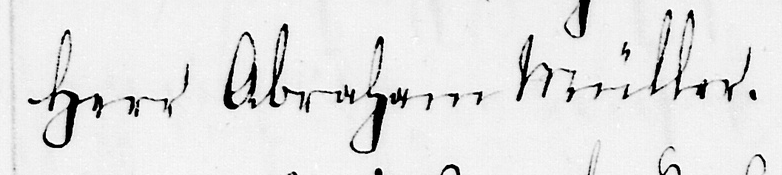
Herr Abraham Müller.
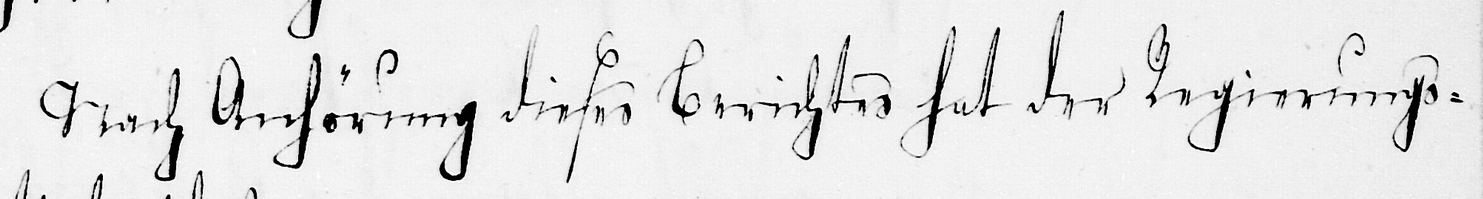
Nach Anhörung dieses Berichtes hat der Regierungs¬
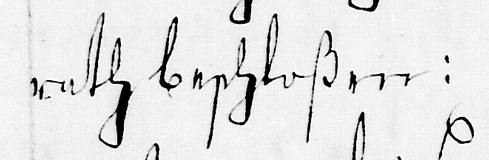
rath beschloßen:
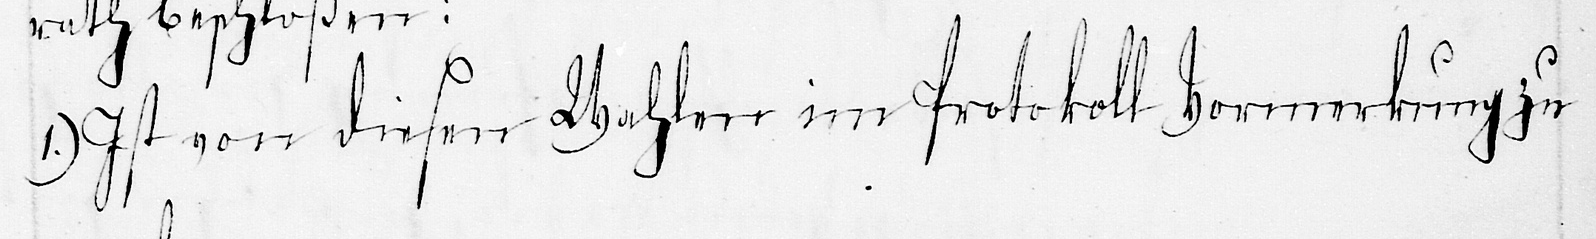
1.) Ist von diesen Wahlen im Protokoll Vormerkung zu
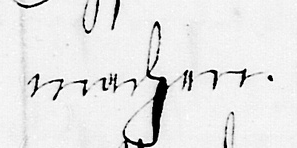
machen.
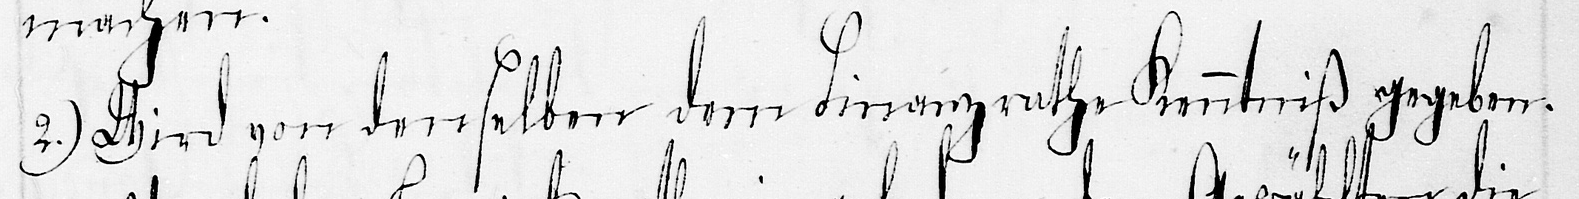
2.) Wird von denselben dem Finanzrathe Kenntniß gegeben.
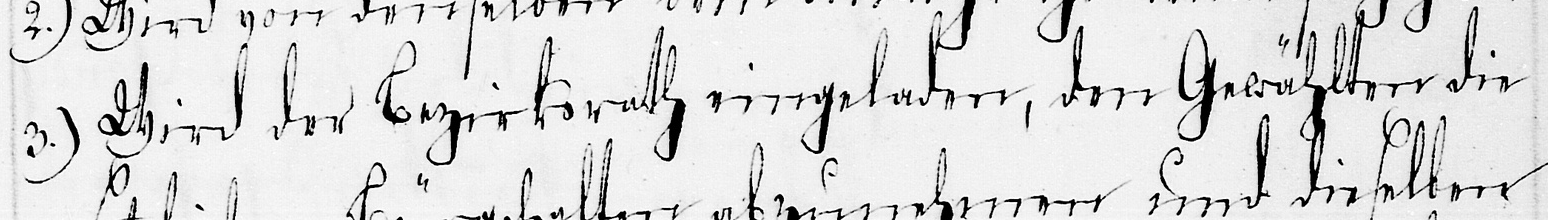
3.) Wird der Bezirksrath eingeladen, den Gewählten die
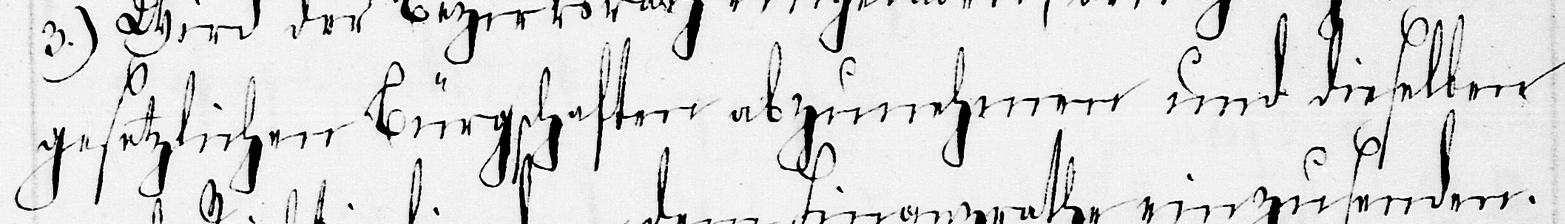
gesetzlichen Bürgschaften abzunehmen und dieselben
